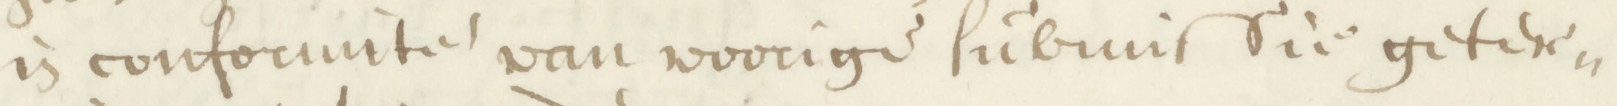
in conformité van voorige submissie geter„
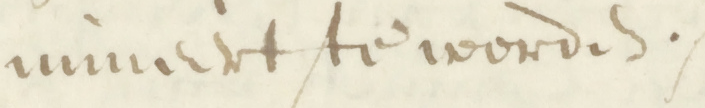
mineert, te worden.
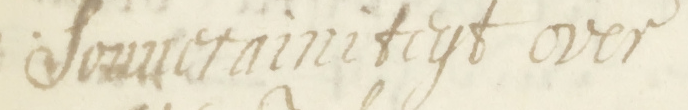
Souverainiteijt over
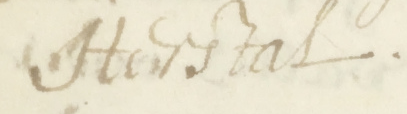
Herstal.
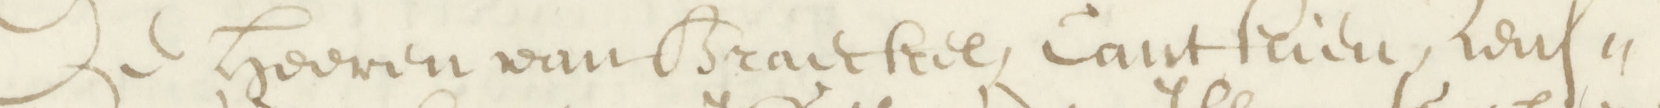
De heeren van Braeckel, Cant Kien, Rens„
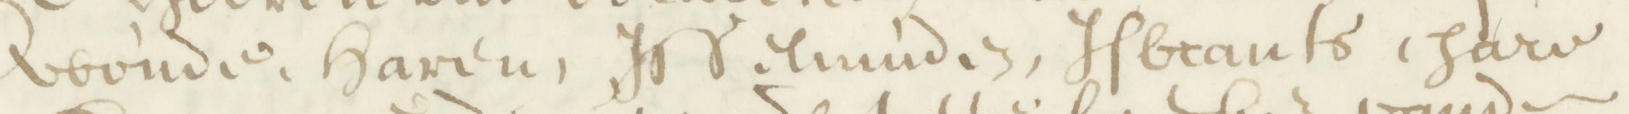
woude, Haren, Isselmuden, Isbrants, hare
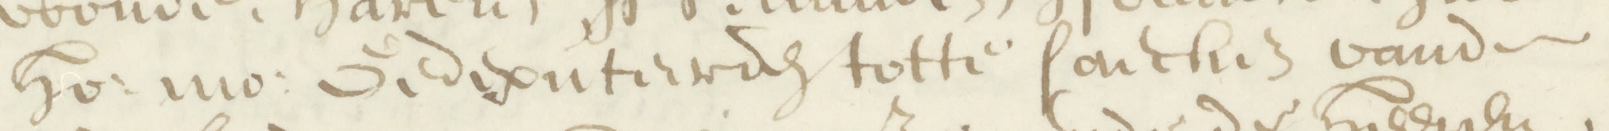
Ho:Mo: Gedeputeerden totte saecken vande
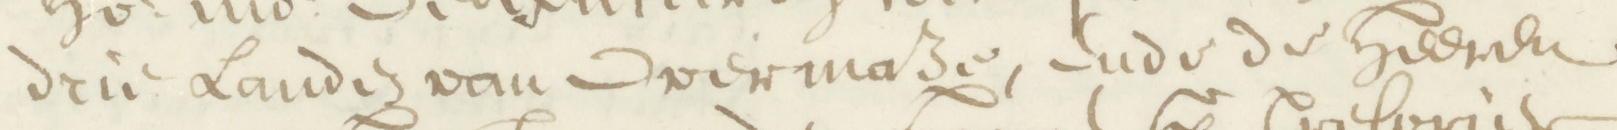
drie Landen van Overmaze, ende de Heeren
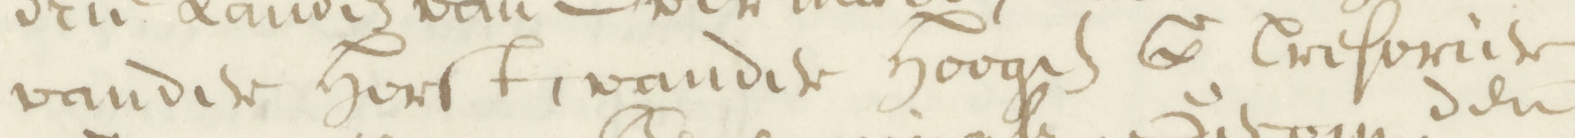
vander Herst, vander Hoogen & Tresorier
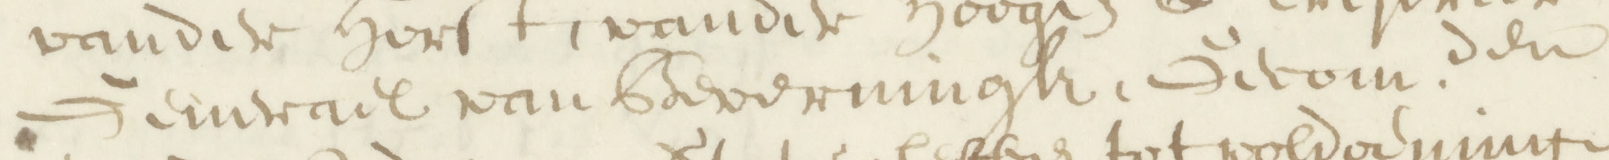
Generael van Beverningk, Gecomden.
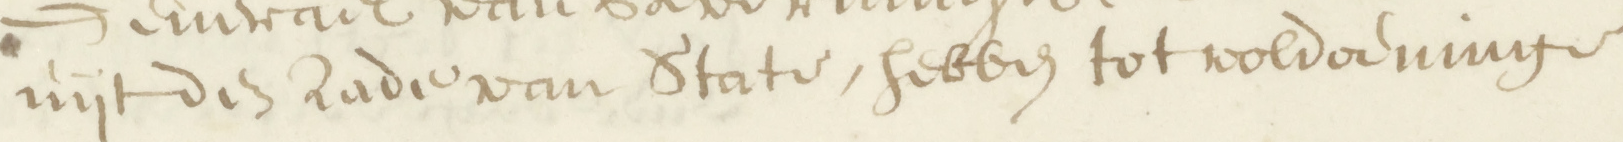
uijt den Rade van State, hebben tot voldoeninge
